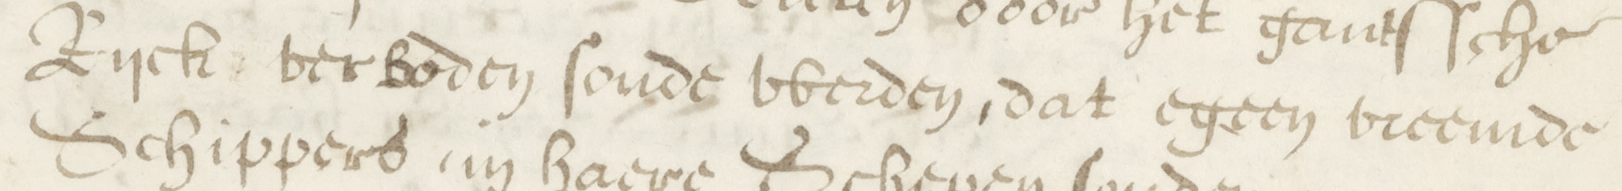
Ryck, verboden soude werden, dat egeen vreemde
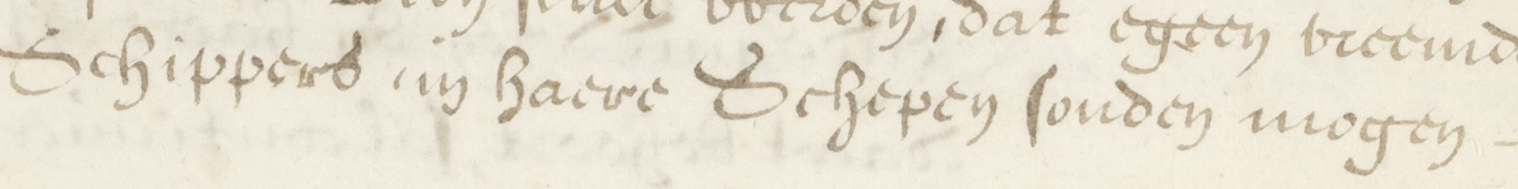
Schippers, in haere Schepen souden mogen
